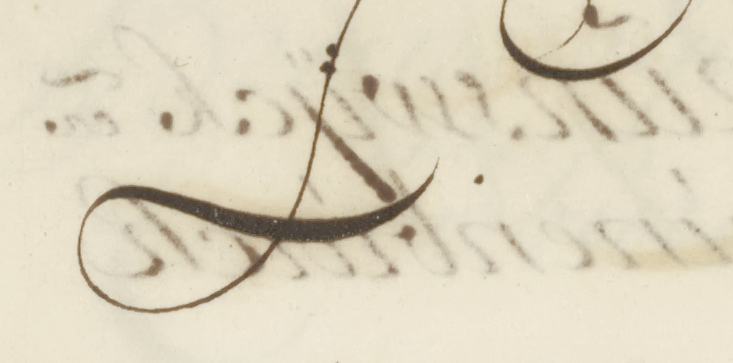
L.
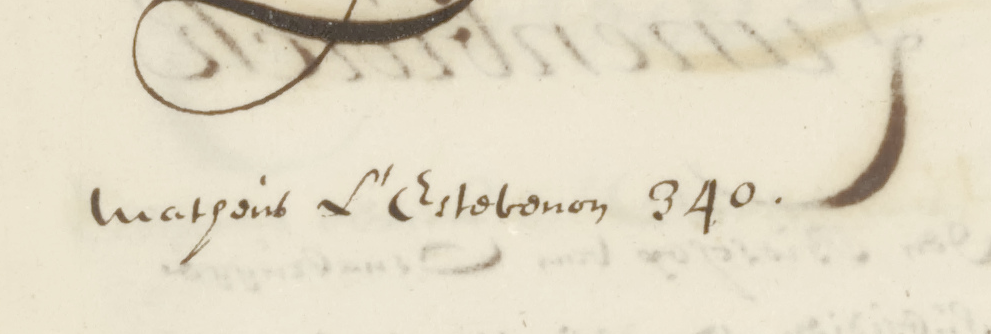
Matheus L‛Estevenon 340.
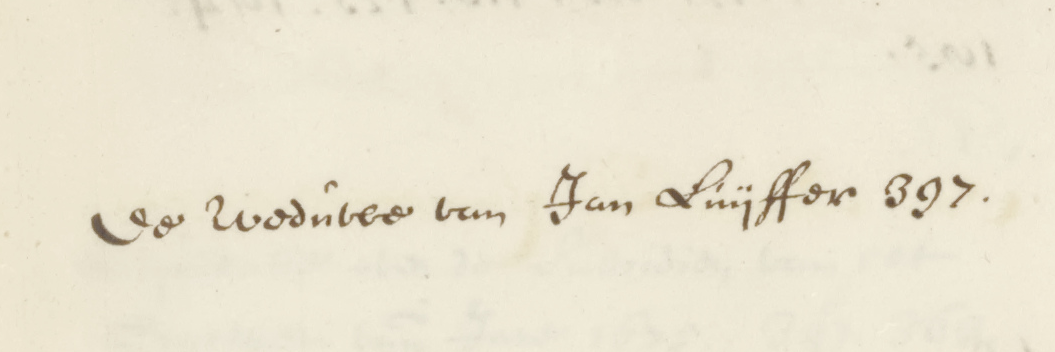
De Weduwe van Jan Luijffer 397.
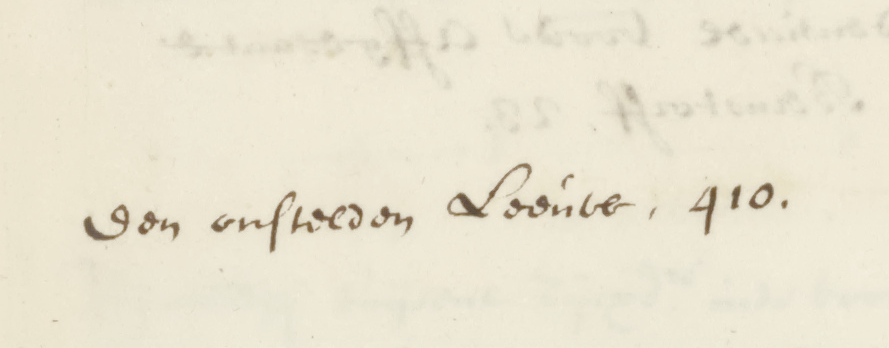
Den onstelden Leeuw. 410.
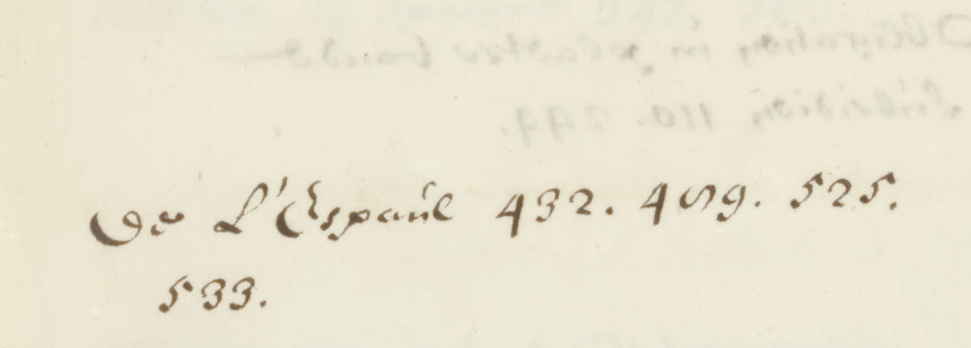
De L‛Espaul 432. 489. 525.
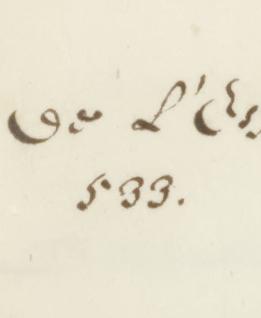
533.
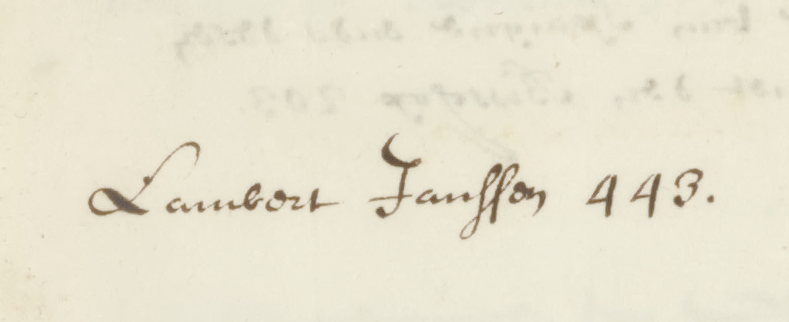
Lambert Janssen 443.
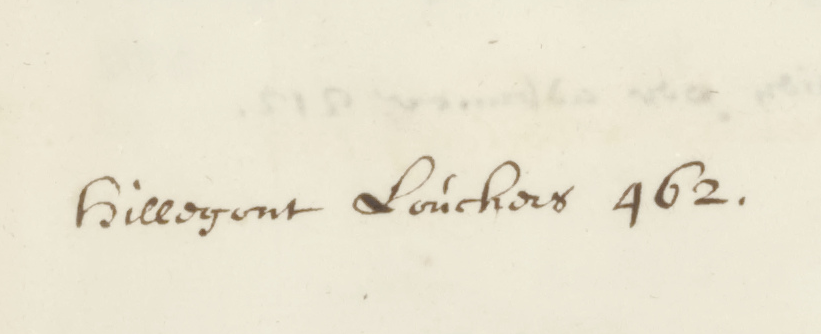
Hillegont Louckers 462.
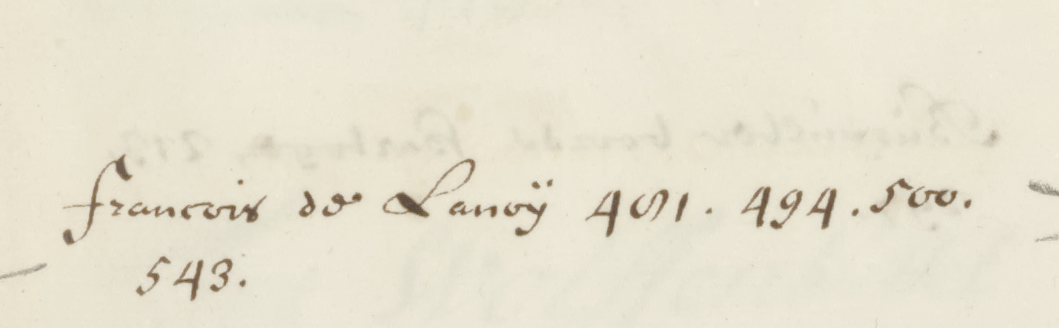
Francois de Lanoij 481. 494. 500.
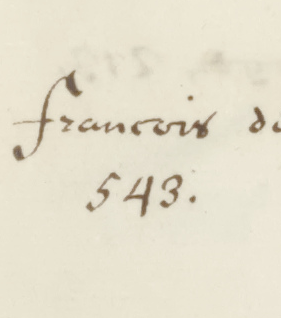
543.
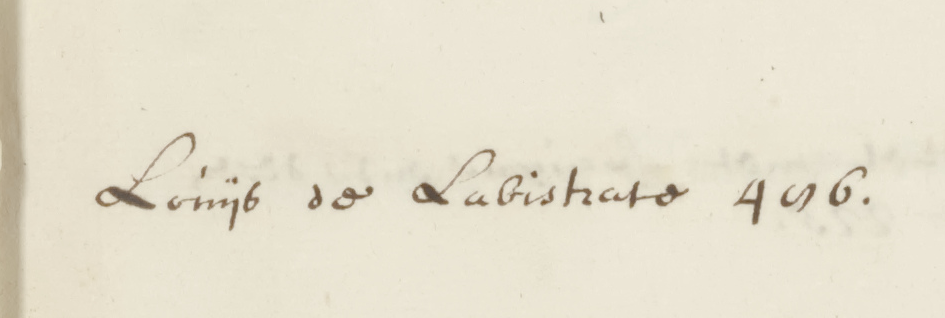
Louijs de Labistrate 486.
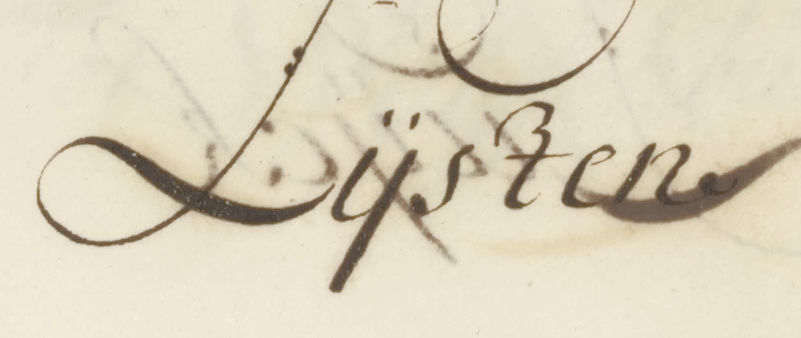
Lijsten
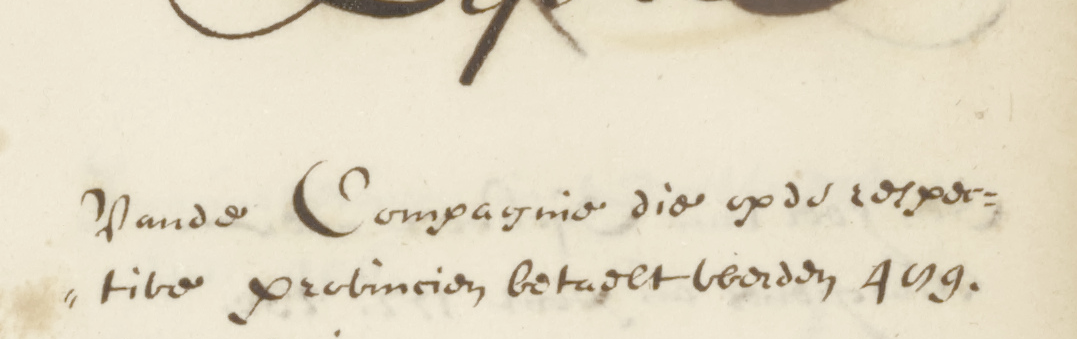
Vande Compagnie die opde respec„
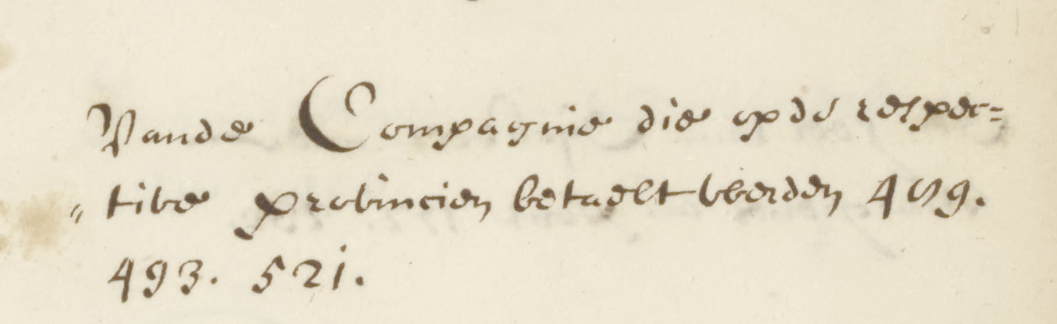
„tive Provincien betaelt werden 489.
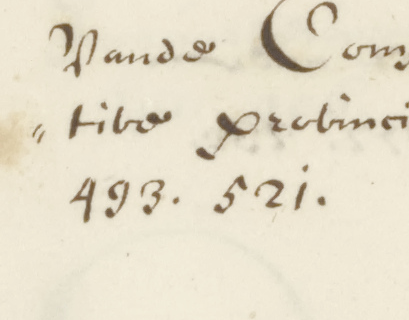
493. 521.
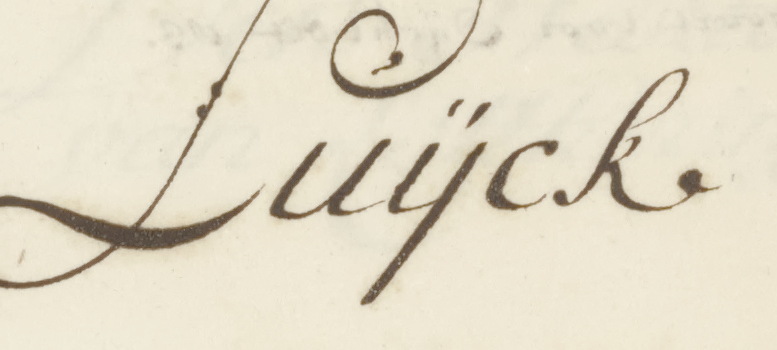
Luijck
